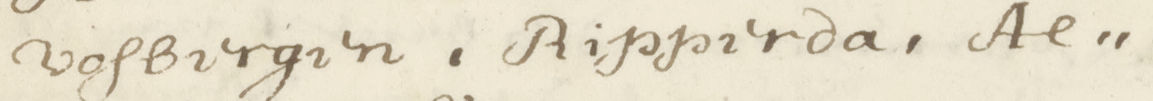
Vosbergen, Ripperda, Al„
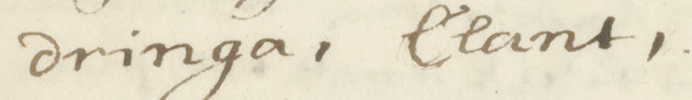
dringa, Clant.
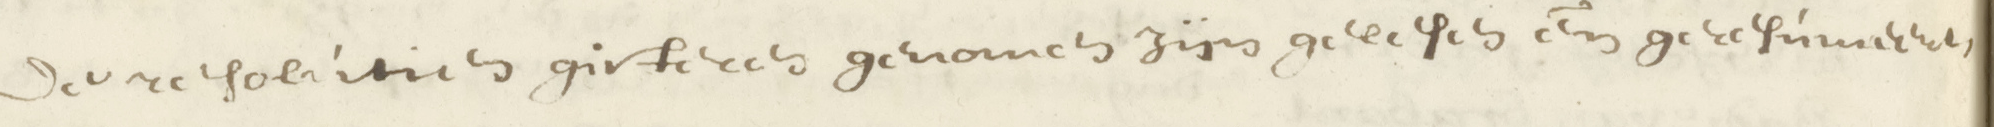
De resolutien gisteren genomen zijn gelesen en geresumeert.
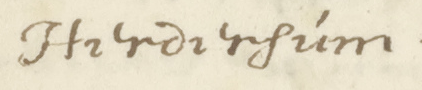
Herdersum
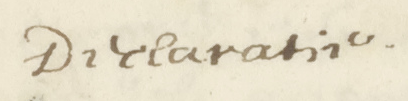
Declaratie
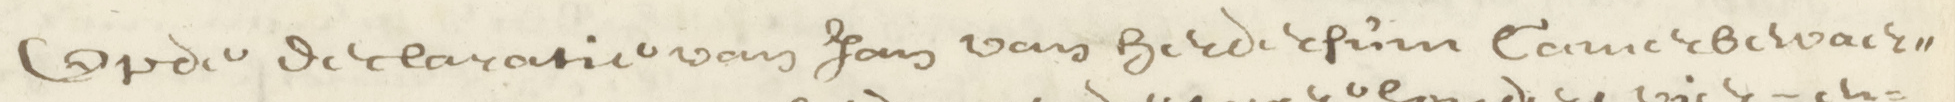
Opde declaratie van Jan van Herdersum Camerbewaer„
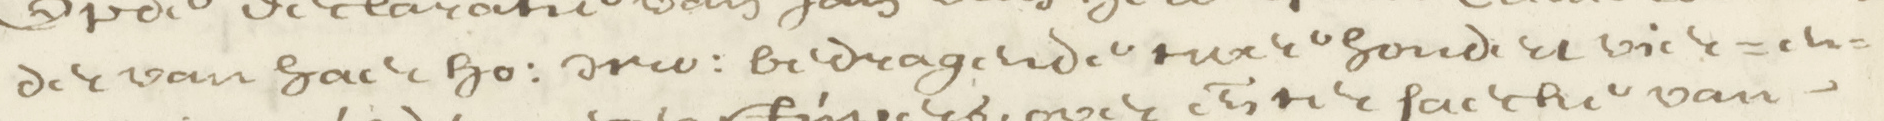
der van haer Ho:Mo: bedragende twee hondert vier=en=
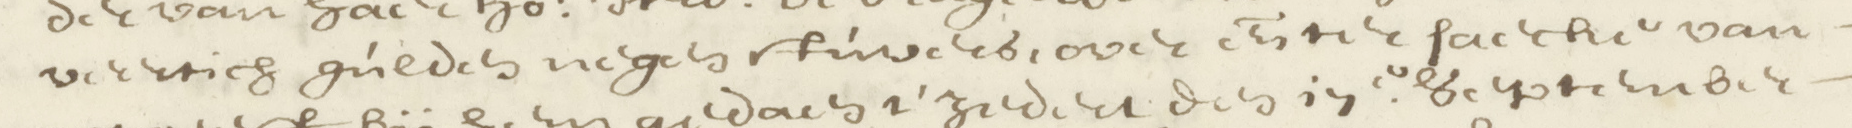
veertich gulden negen stuvers over en ter saecke van -
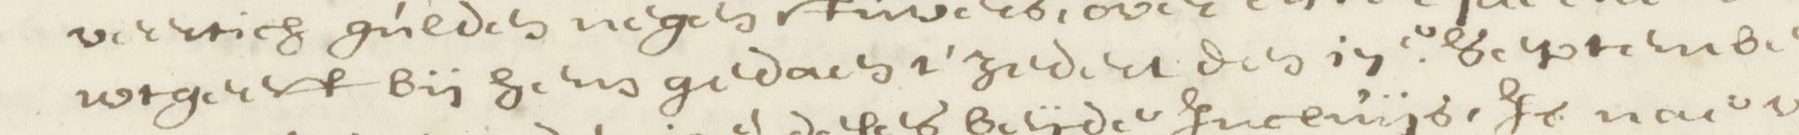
wtgeef bij hem gedaen zedert den 17en september -
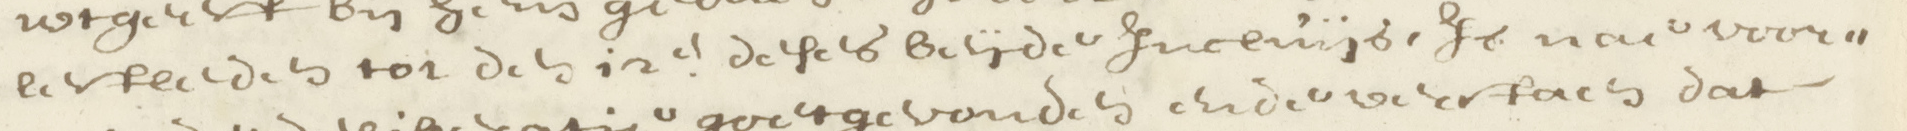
lestleden tot den 12e deses beijde Incluijs, Is nae voor„
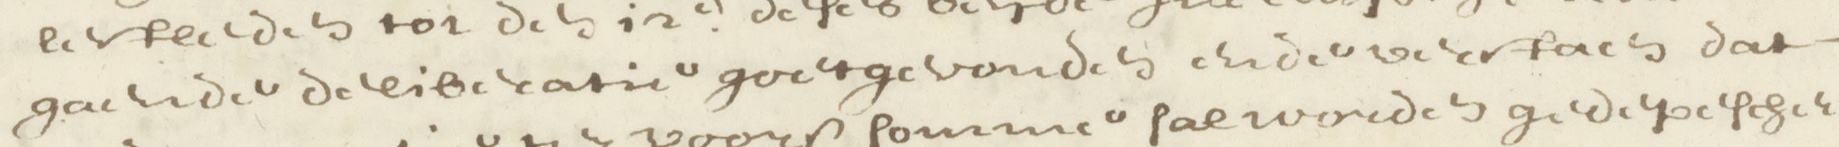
gaende deliberatie goetgevonden ende verstaen dat -
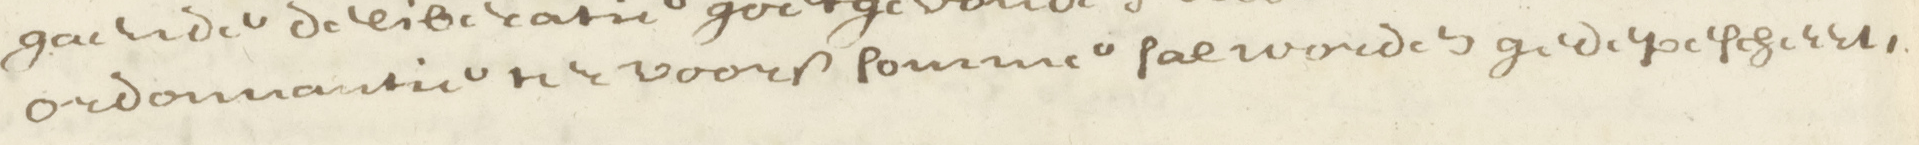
ordonnantie ter voors somme sal worden gedepescheert.
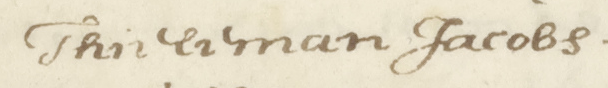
Thieleman Jacobs.
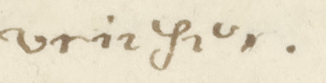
Vriese.
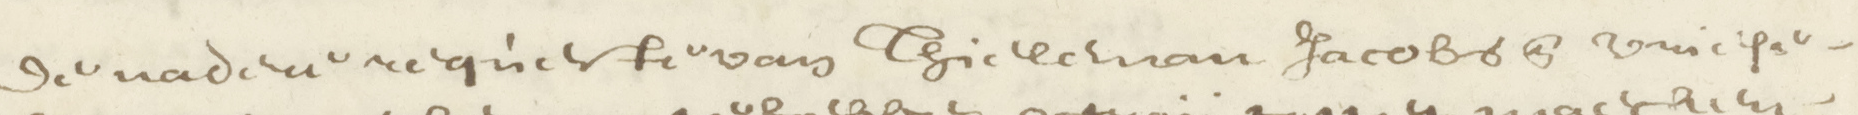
De nadere requeste van Thieleman Jacobsz. Vriese
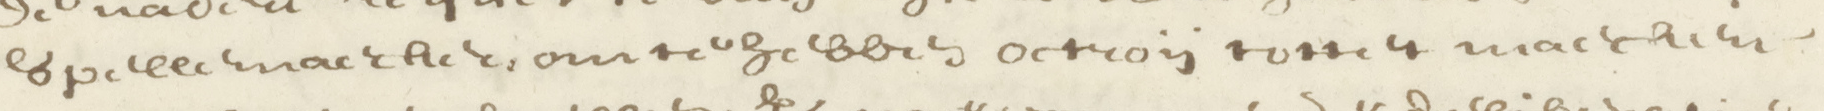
spellemaecker, om te hebben octroij tottet maecken
